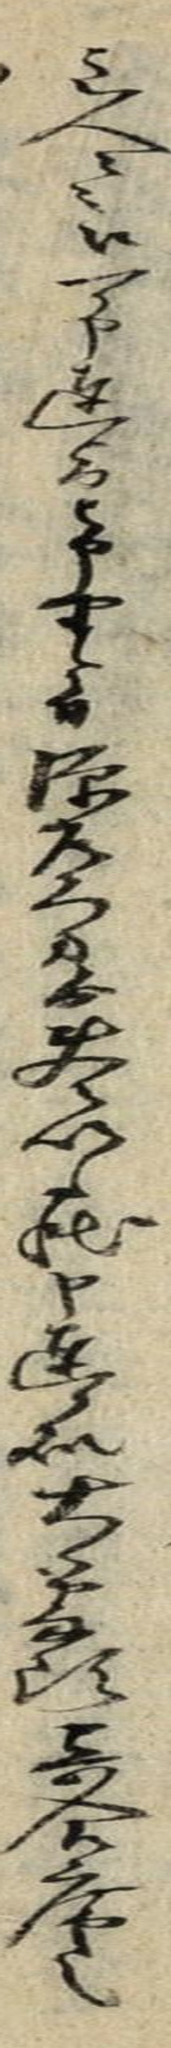主人〃〃江可申達旨被申聞候付源左衛門方ゟ夫々以手紙申達候処大御番頭寄合席之
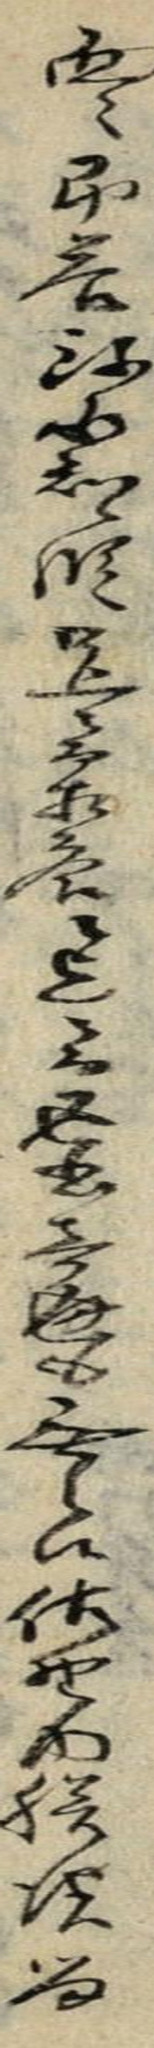面々即答致承知候段々口上に而相答候迄に而返書壱通も無之候佐野内膳儀は留
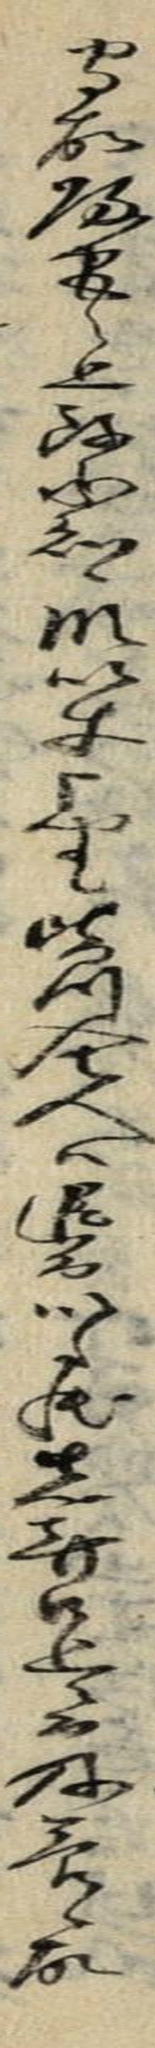守故帰宅之上致承知候段以使申聞候皆川舎人は追而以手紙先刻口上に而及答に候故
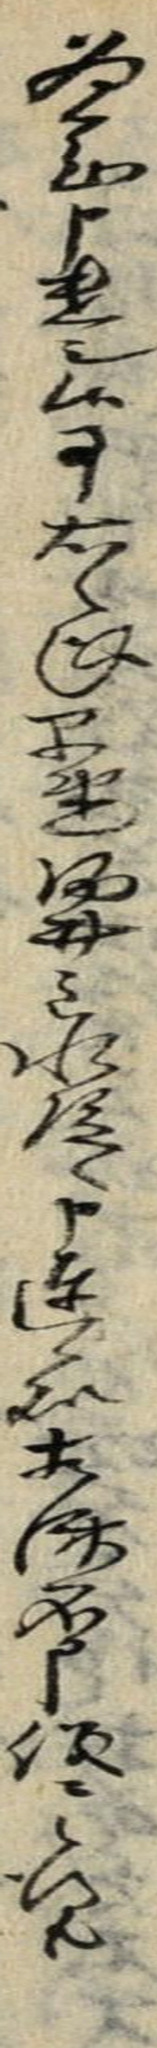為知申遣し候事右之趣早速酒井主水殿へ申達候処相済不申儀に候得共
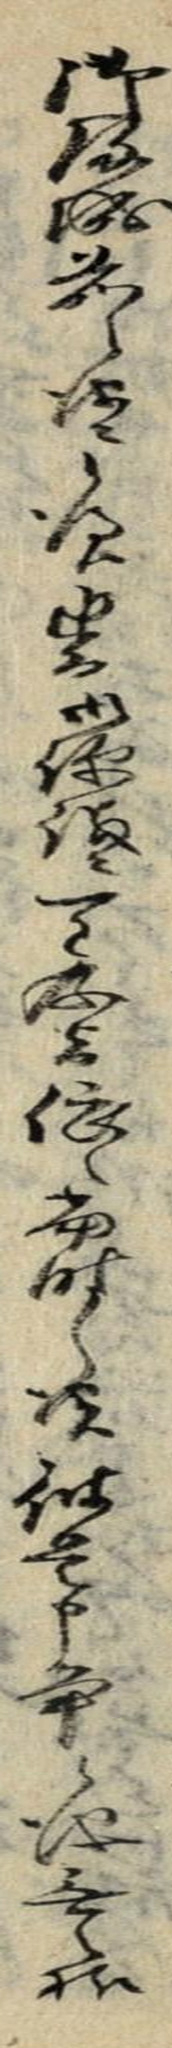御帰城前之儀に候得は追而御評議に可被及旨依之当時之儀は彼是申争之儀無之様
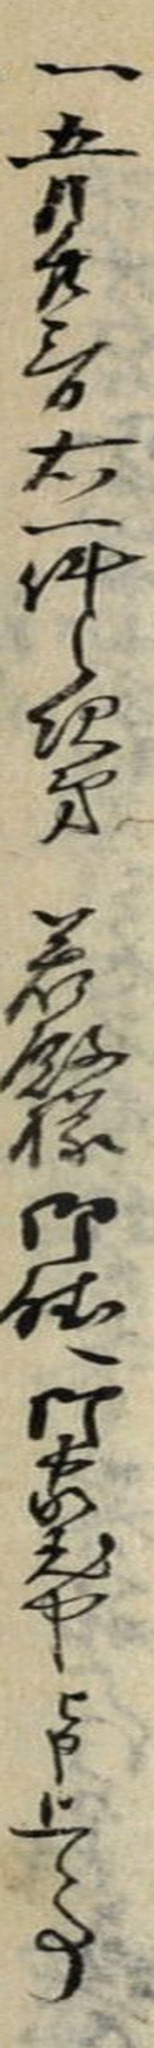一五月廿三日右一件之次第若殿様御聴へ御家老中被申上候事
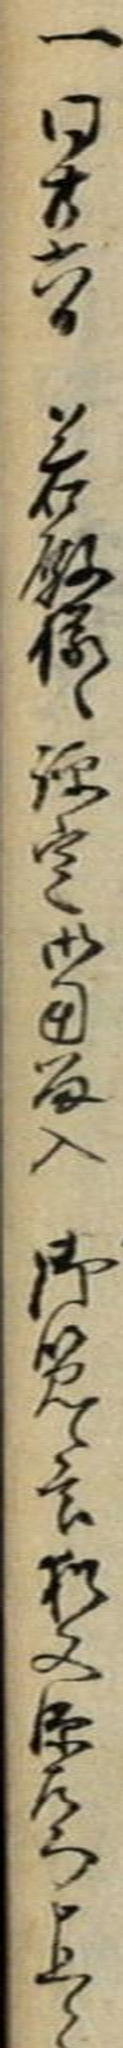一同廿六日若殿様へ評定之御用留入御覧候節猶又源左衛門申上候事
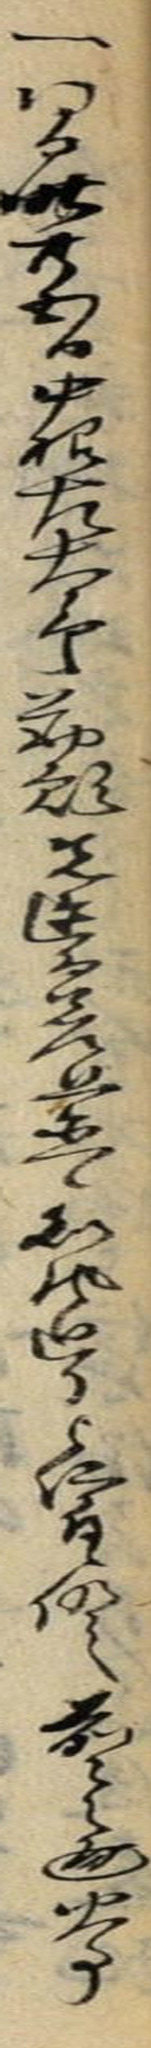一同日昨廿五日中根左太郎勤願先達而差上置候処風廻り被仰付仍之前々之通火事
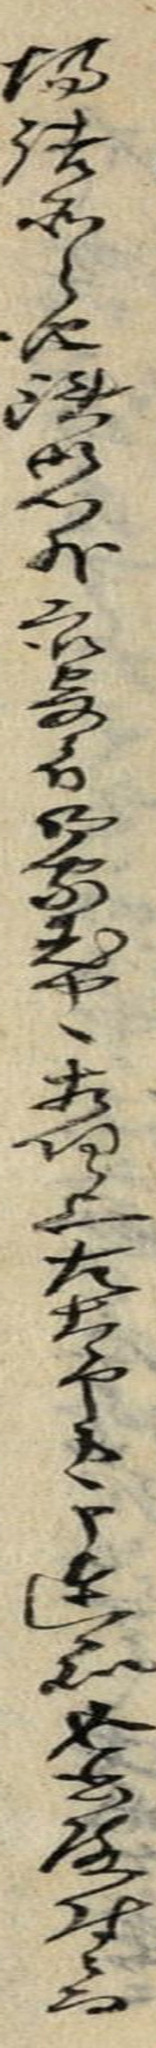場詰所之儀鉄御門外最寄に付御家老中へ相伺候上左太郎方へ申達候処返書殿付に而
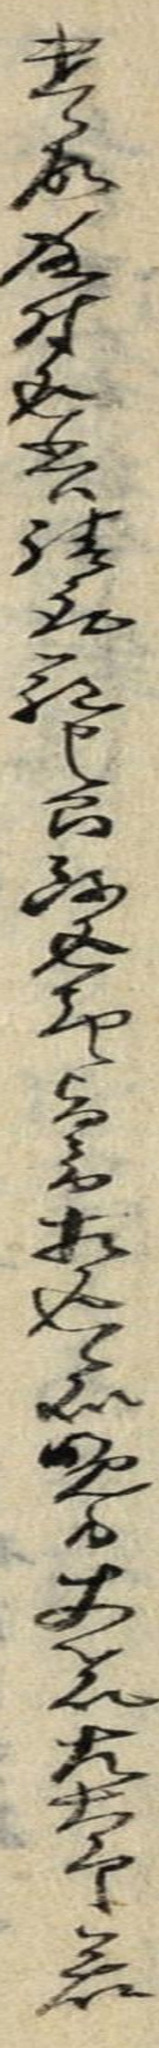遣候故殿付返書は請取難申候間致返却候旨に而相返候処晩方使を以左太郎若
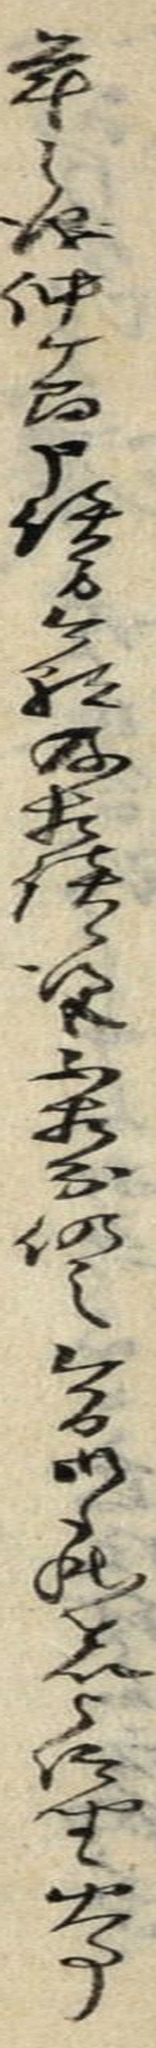年之儀仲ヶ間申談方今朝及相談候得共不相分仍之今日御手紙を以被仰聞候火事
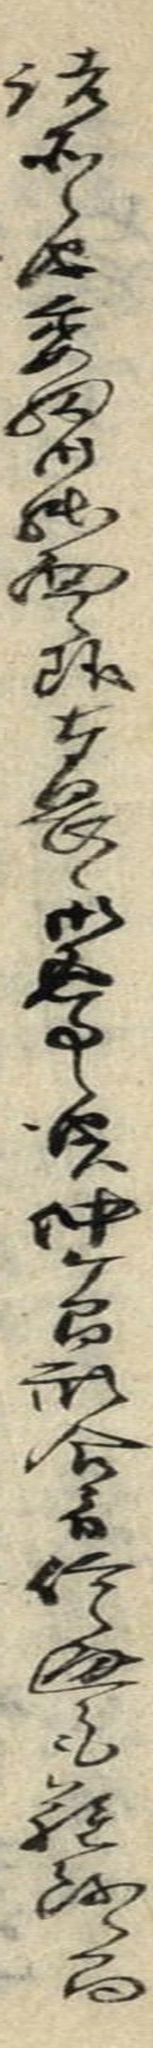詰所之儀委細御紙面之趣奉畏候御返事之儀は仲ヶ間都合に付仰之通にも難致候間
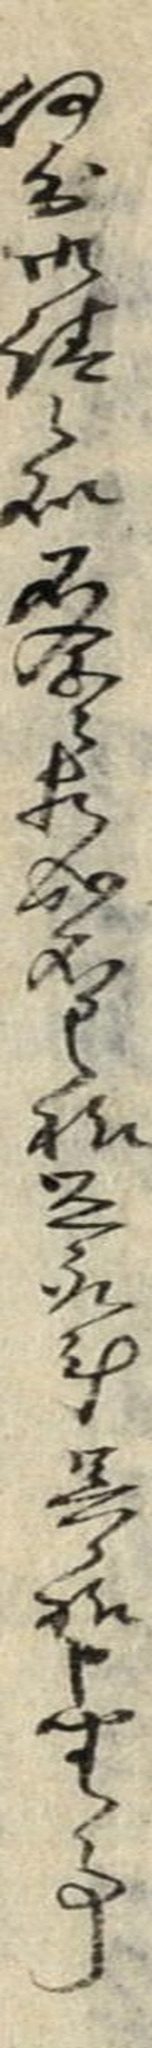何分御請之処不念に相成不申候様宜取斗呉候様申聞候事
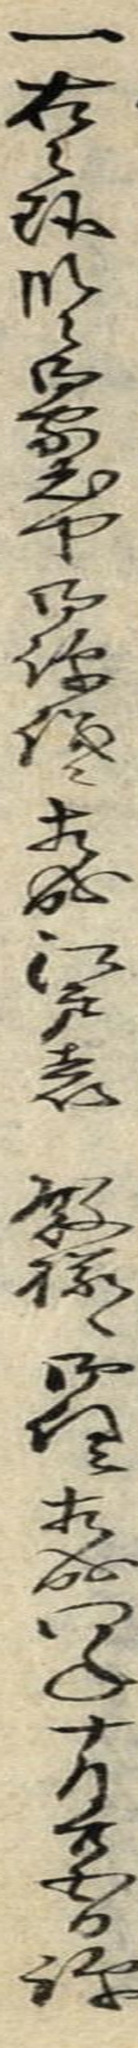一右之趣段々御家老中御評議に相成江戸表殿様へ御伺に相成同年十月廿五日評
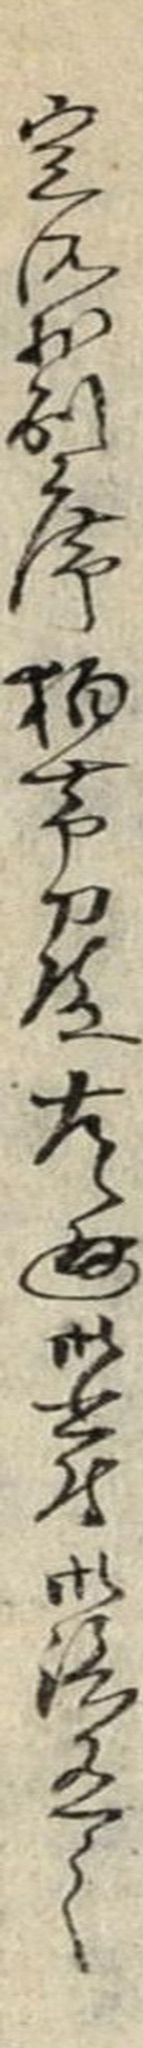定所於列席狛帯刀殿左之通御書付御渡有之
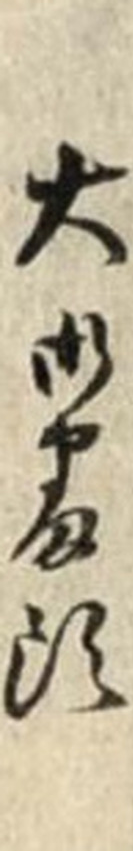大御番頭
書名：蒐輯之部
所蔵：福井県文書館 Fukui Prefectural Archives
